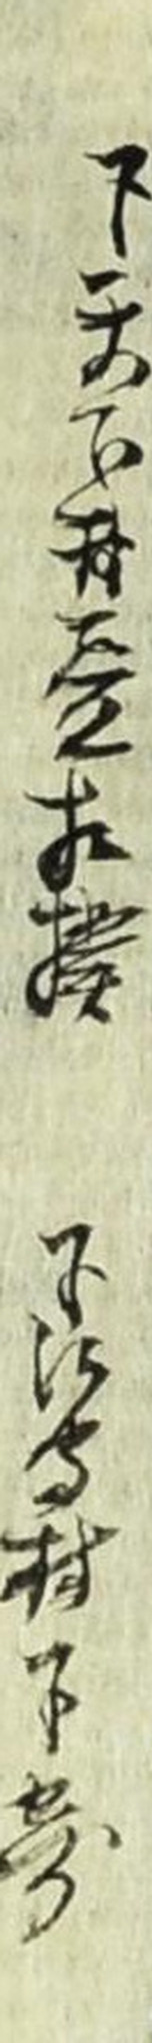下天下村昼相撲下江守村下寄
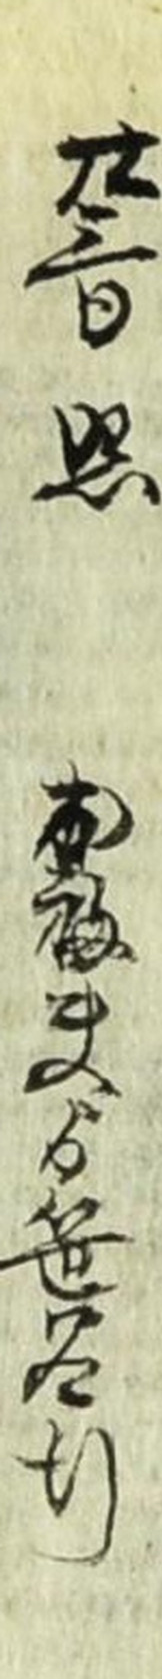廿三日照出福夫ゟ笹谷行
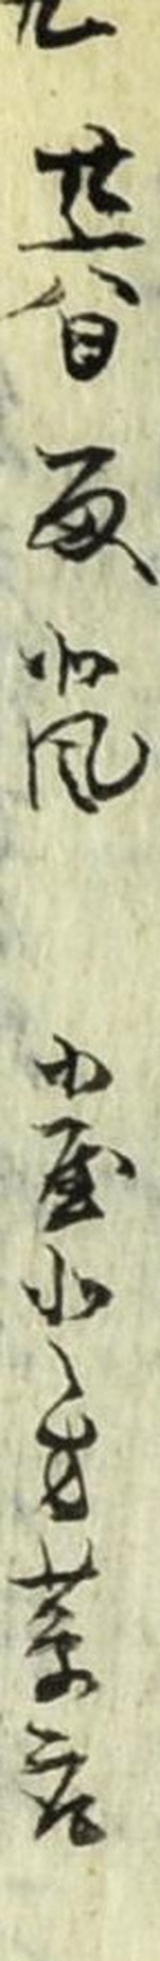廿六日雨北風小屋北之方草取
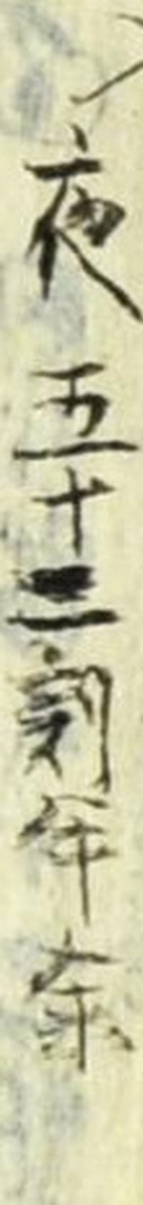夜五十二刻半余

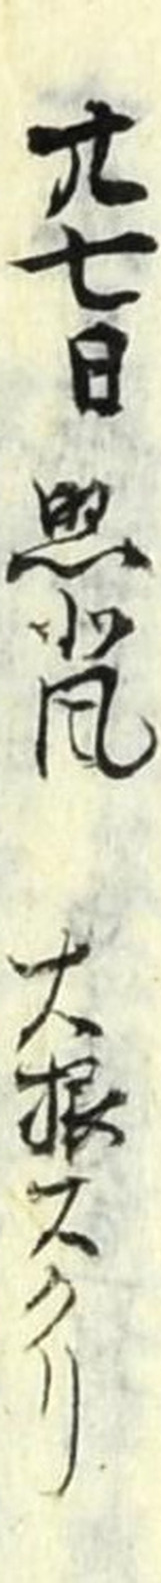廿七日照北風大根スクリ
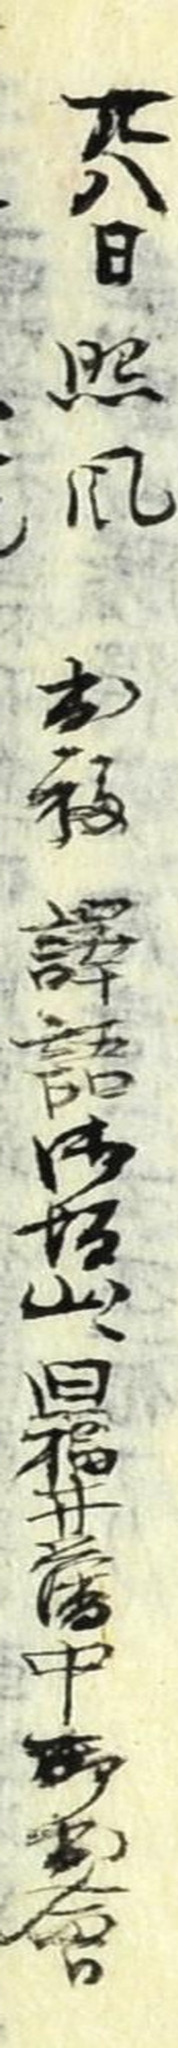廿八日照風出福訳語御坂山へ旧福井藩中御出会
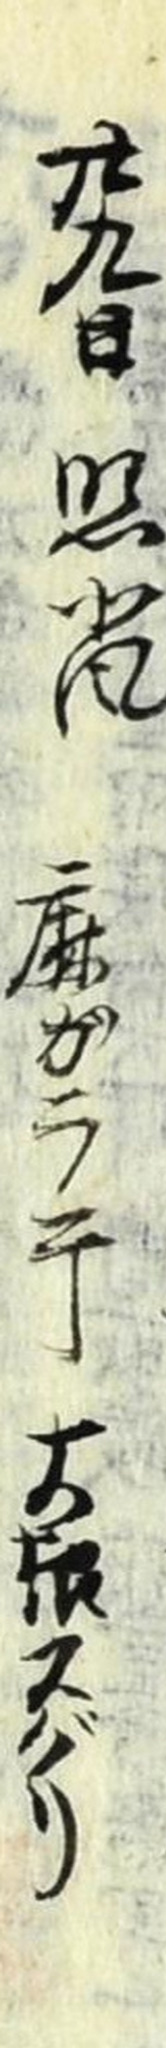廿九日照北風麻ガラ干大根スグリ
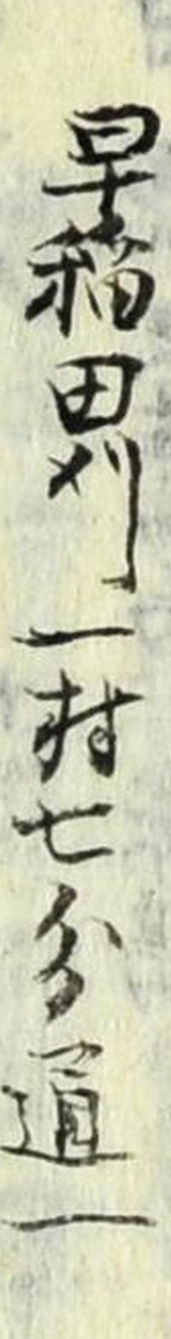早稲田刈一村七分通一
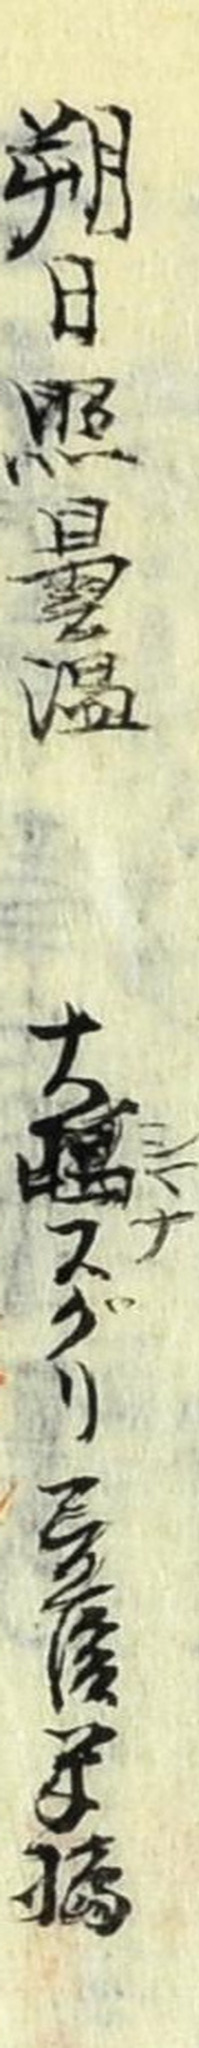朔日照曇温大島スグリ昼後米搗
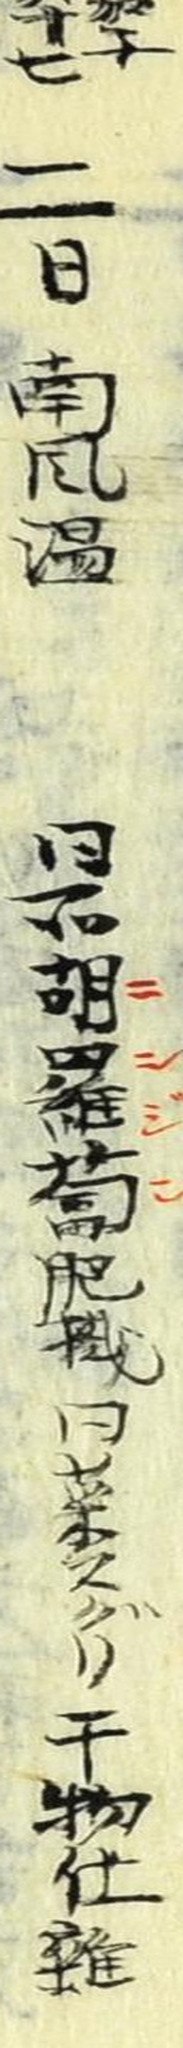二日南風温同所胡羅蔔肥掛同菜スグリ干物仕雑
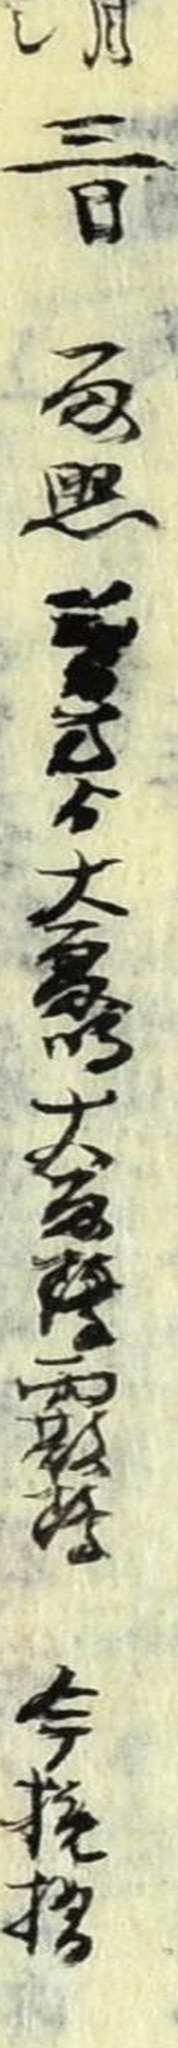三日雨照暮方ゟ大雷鳴大雨降霰降今挽摺
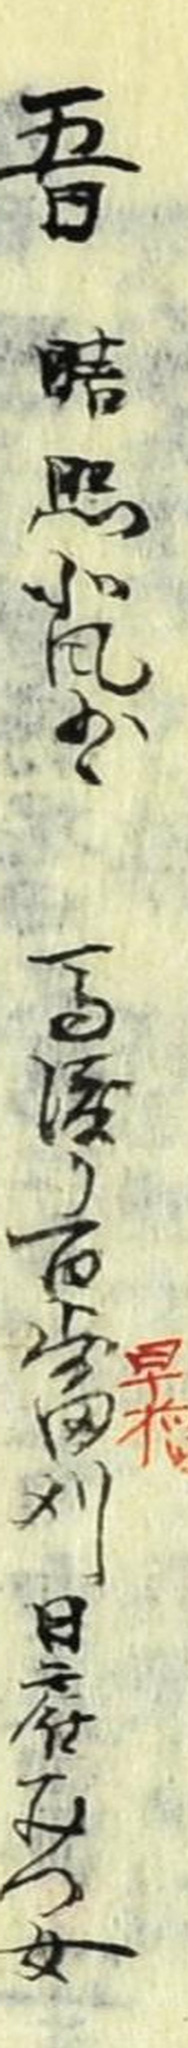五日晴照北風少々馬渡り百歩田刈日雇みつ女
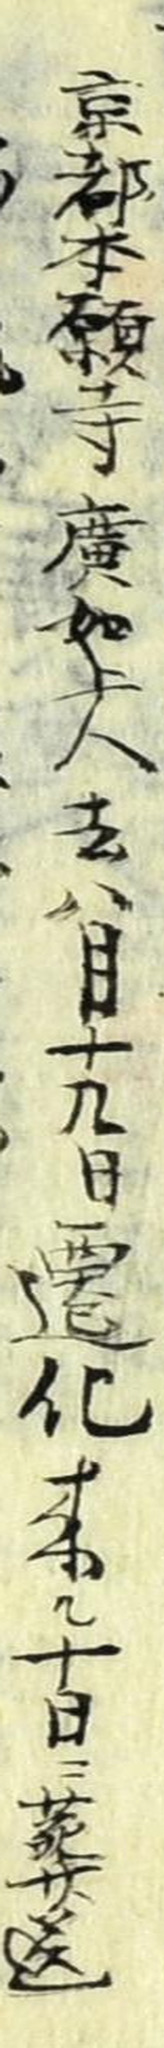京都本願寺広如上人去八月十九日遷化来ル十日ニ葬送
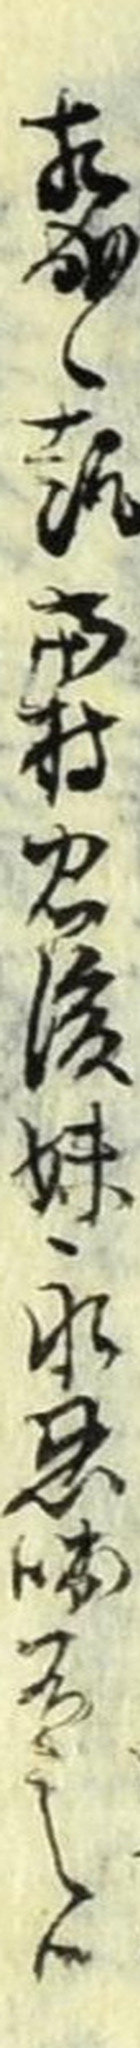相成候趣当村忠後妹永恩咄有之候
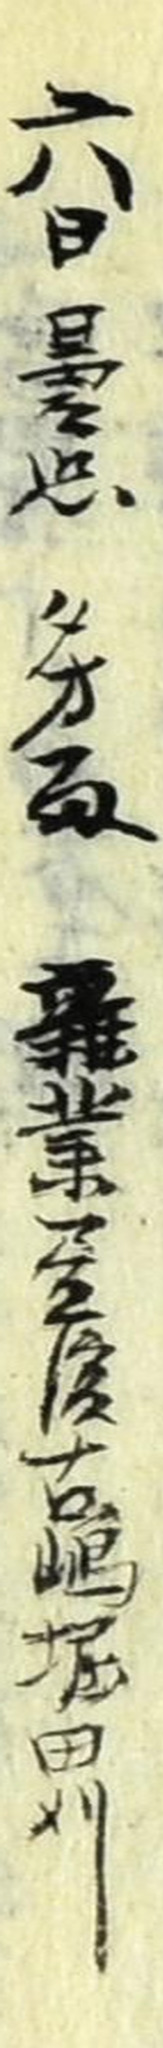六日曇照夕方雨雑業昼後古島堀田刈
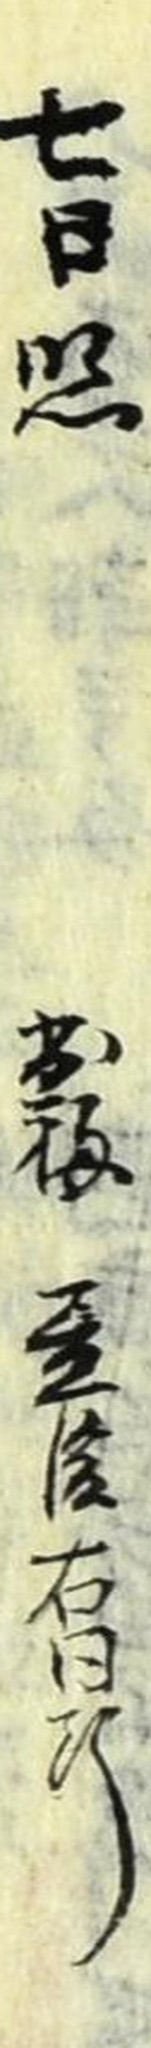七日照出福昼後右同断
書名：（日記）
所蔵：福井県文書館 Fukui Prefectural Archives
